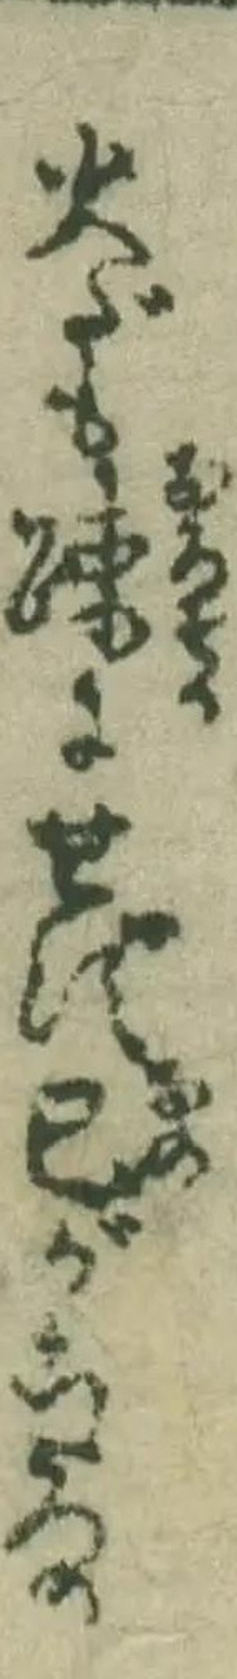火だも疎にせず己がこゝろの
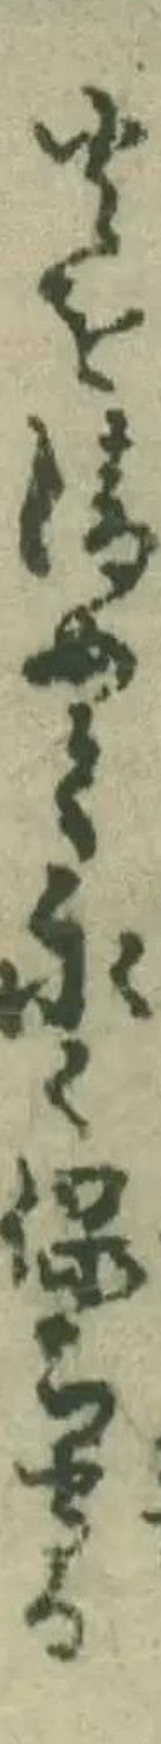火を清めて永く保ち守る
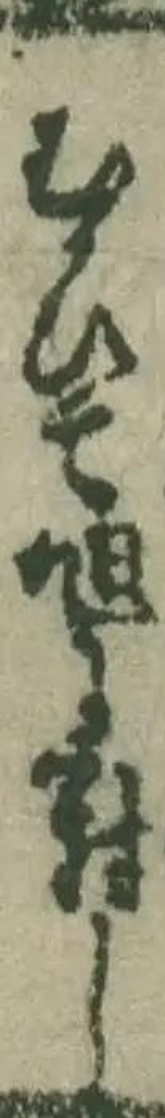むかひて旭に對し
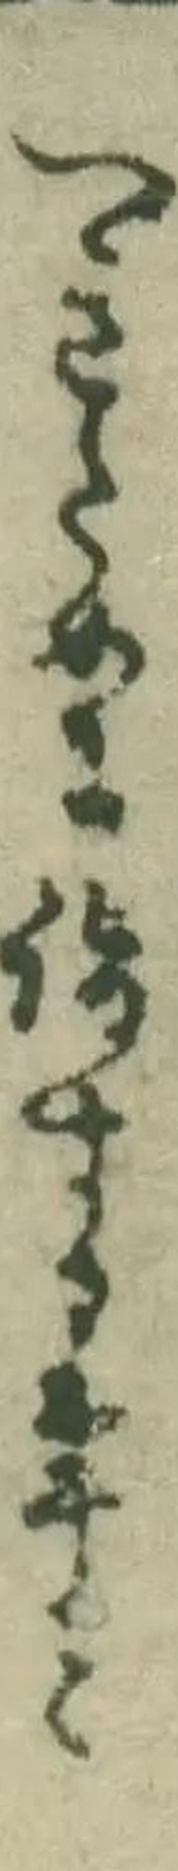べきために詣する事と
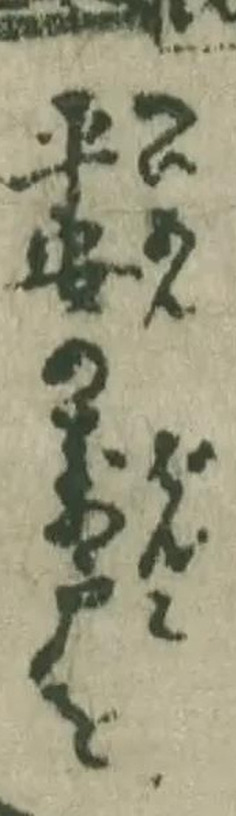平安の萬戸を
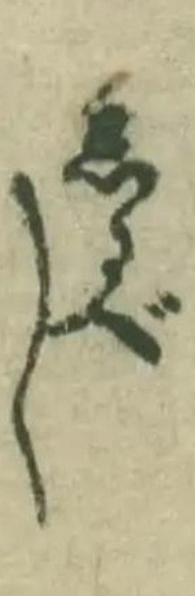しるべし
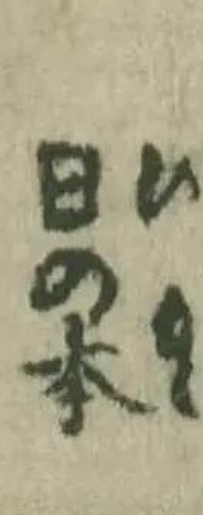日の本
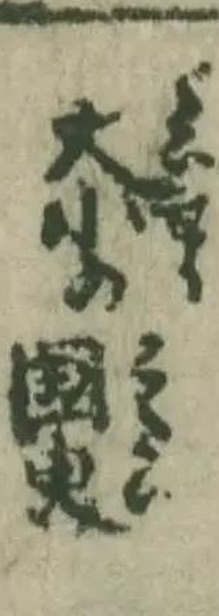大小の国界
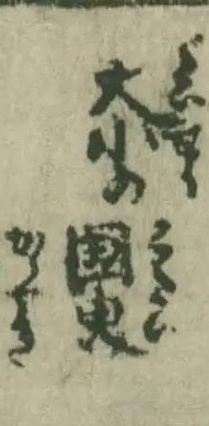大小の国界
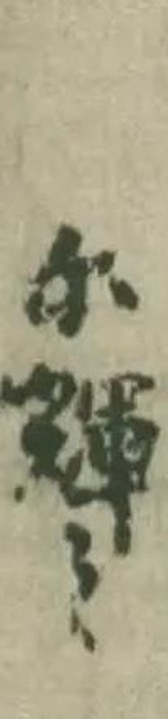に輝て
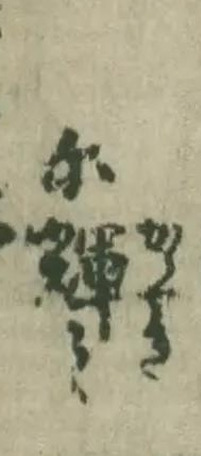に輝て
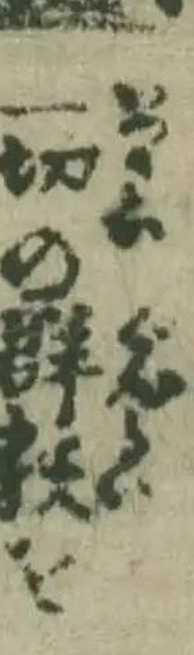一切の群類を
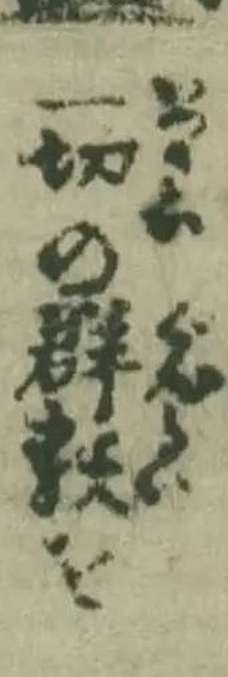一切の群類を
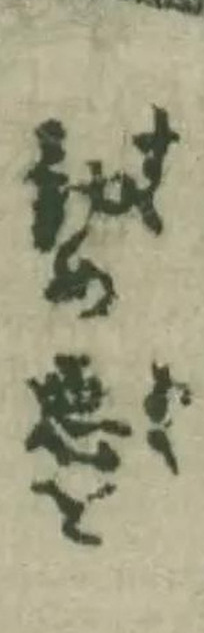勧め悪を
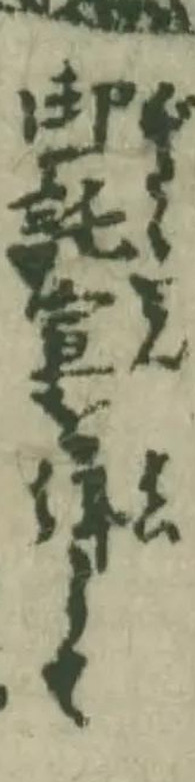御託宣を拝して
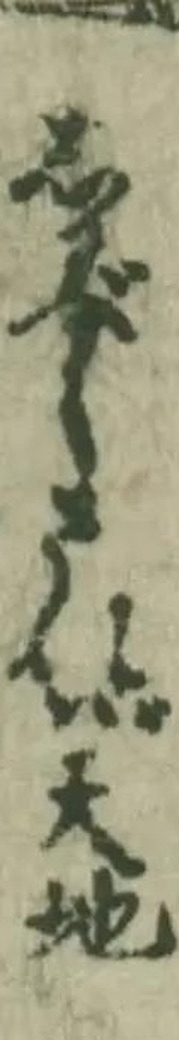しるべしされば天地
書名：信濃國六郡大地震滿水之圖
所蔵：国立国会図書館 National Diet Library, JAPAN
